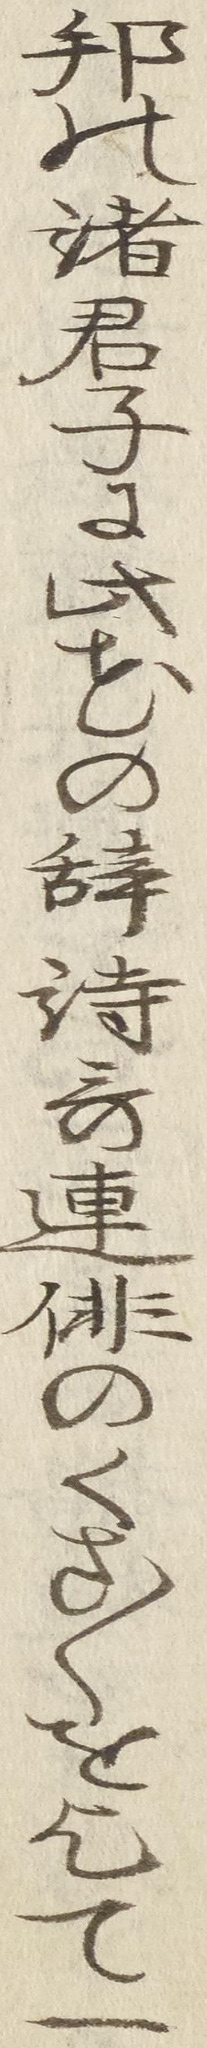の諸君子に此花の辞詩奇連俳のくさ〳〵を乞て一
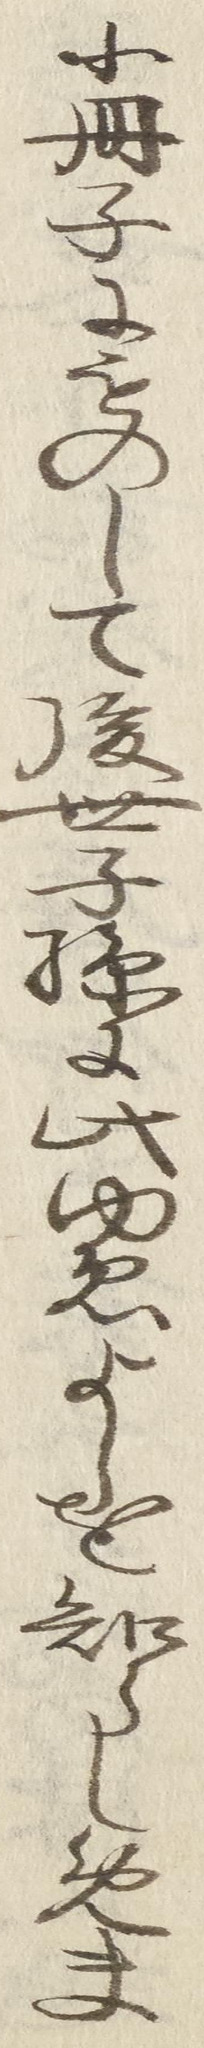小冊子にものして後世子孫に此ゆえよしを知らしめま
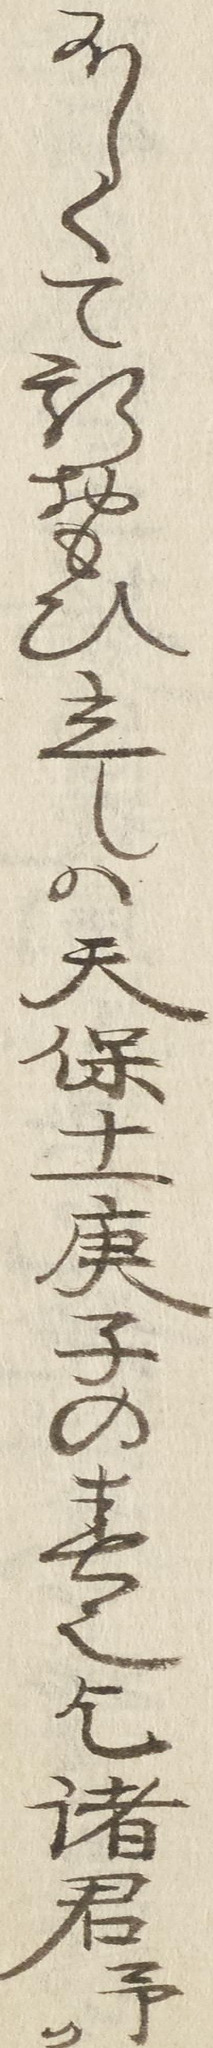ほしくて斯おもひ立しは天保十一庚子の春也乞諸君予か
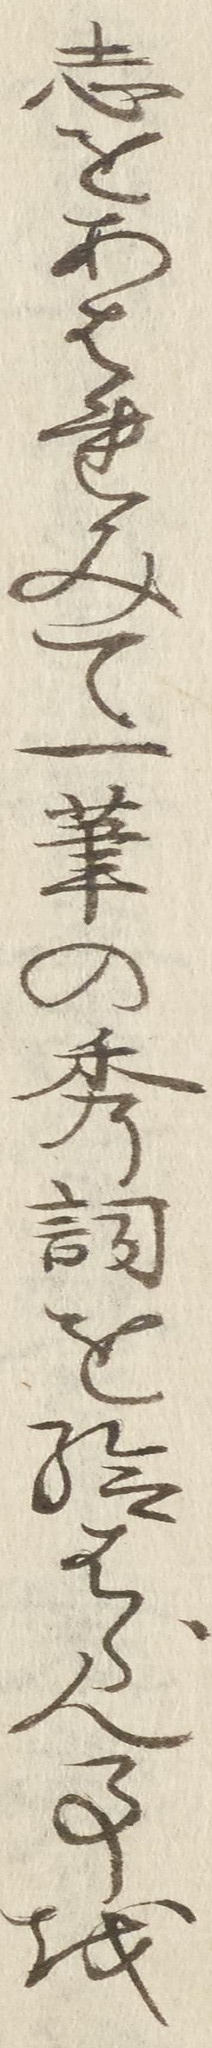志をあわれみて一葦の秀詞を給わらん事を
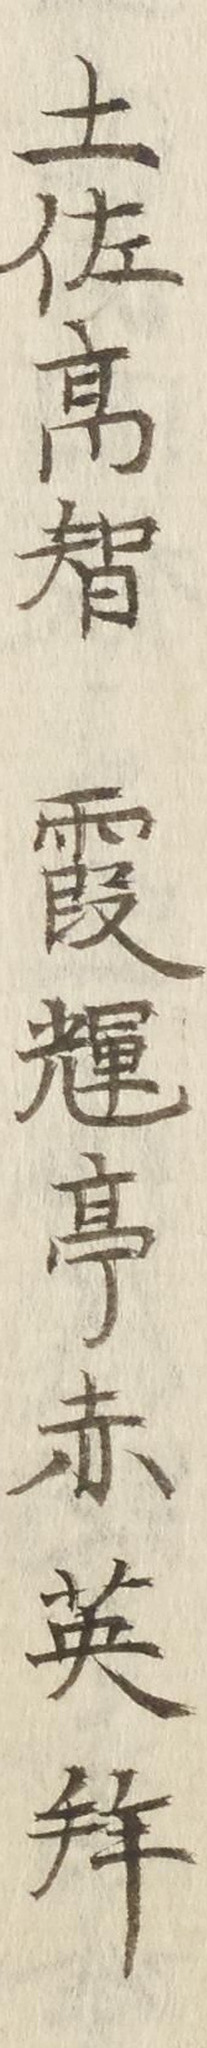土佐高智霞輝亭赤英拝
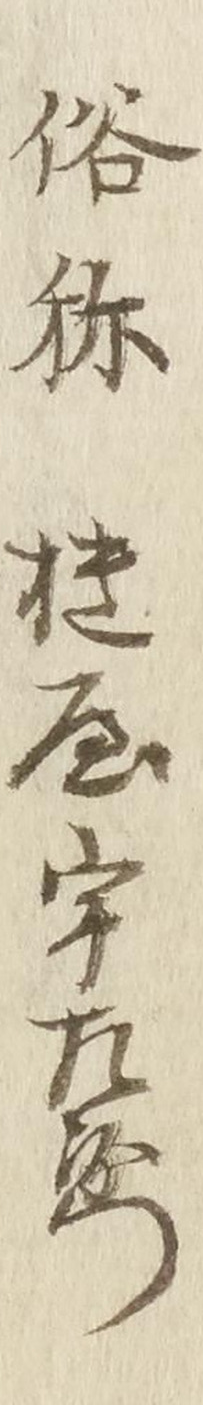俗称櫃屋宇左衛門
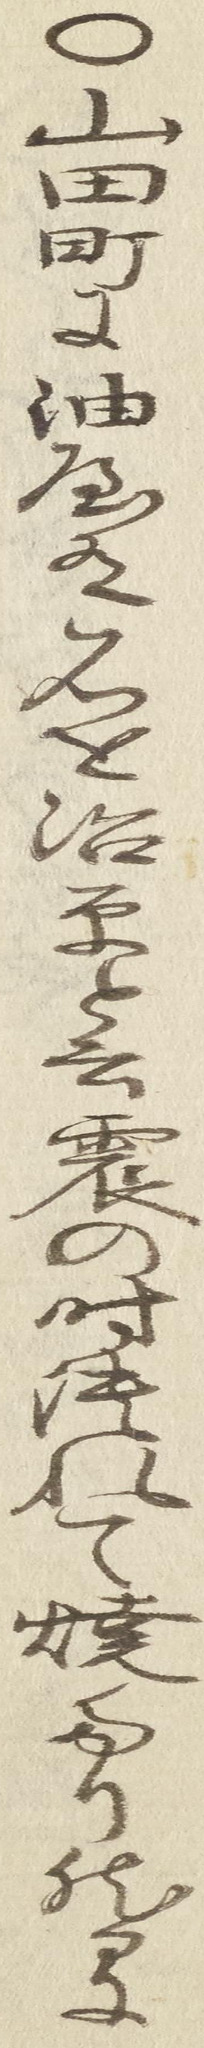〇山田町に油屋有名を治平と云震の時潰れて焼たり然るに
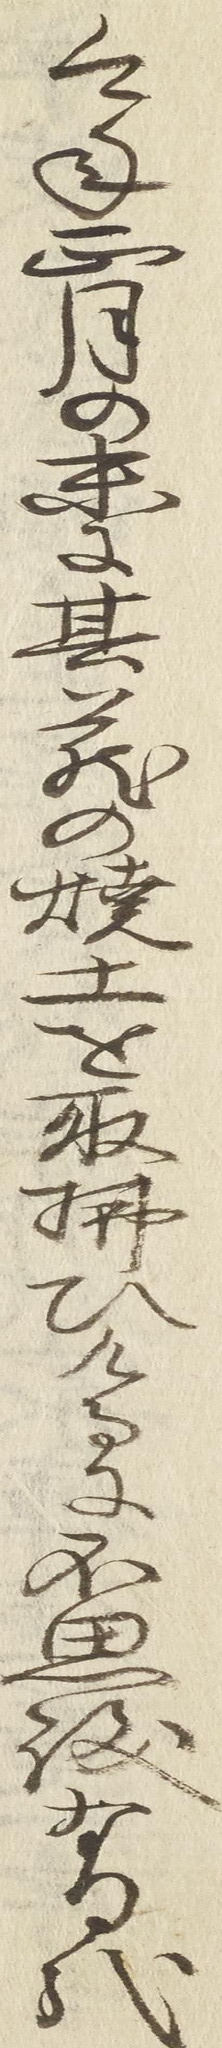今年正月の末に其蔵の焼土を取払ひけるに不思議なる哉
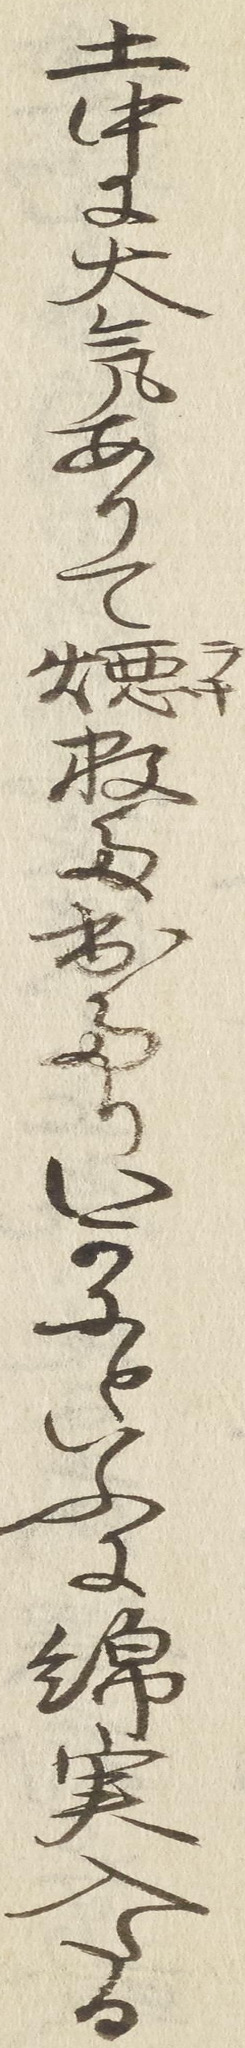土中に火気ありて樮数多出たりいかにといふに綿実入たる
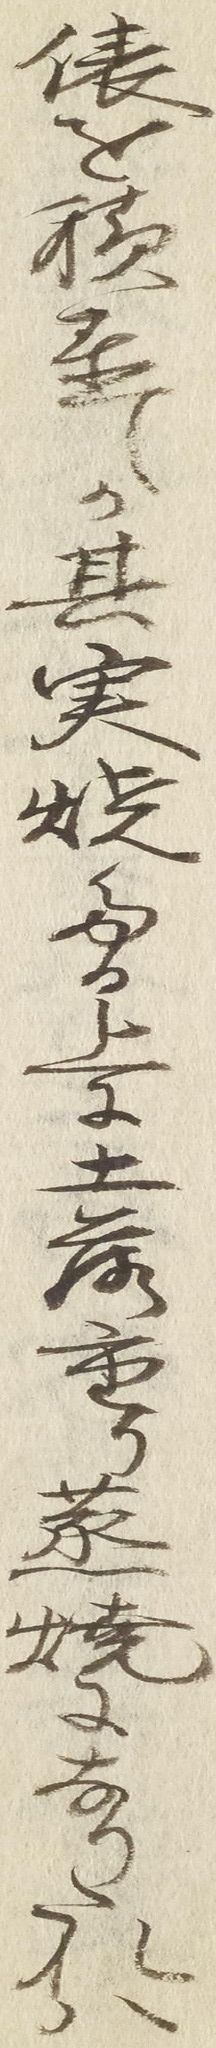俵を積置しか其実焼たる上に土落重り蒸焼になりたれは
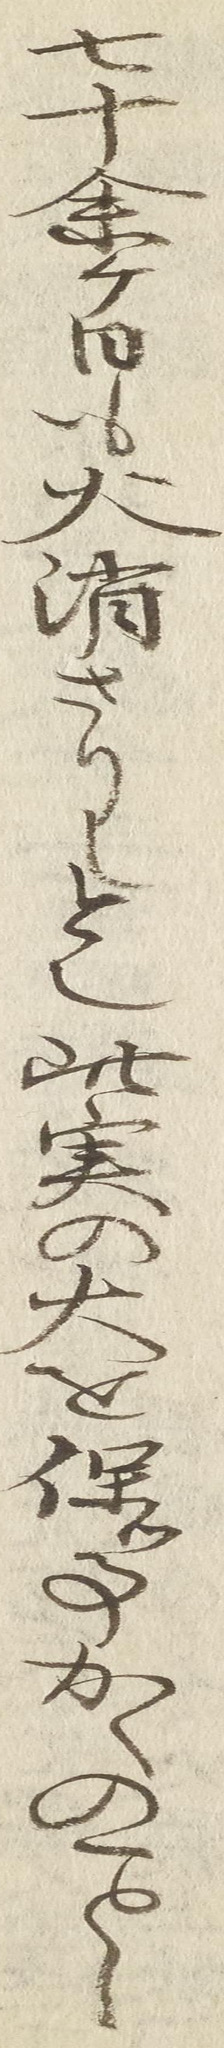七十余ケ日も火消さりしと也此実の火を保つ事かくのことし
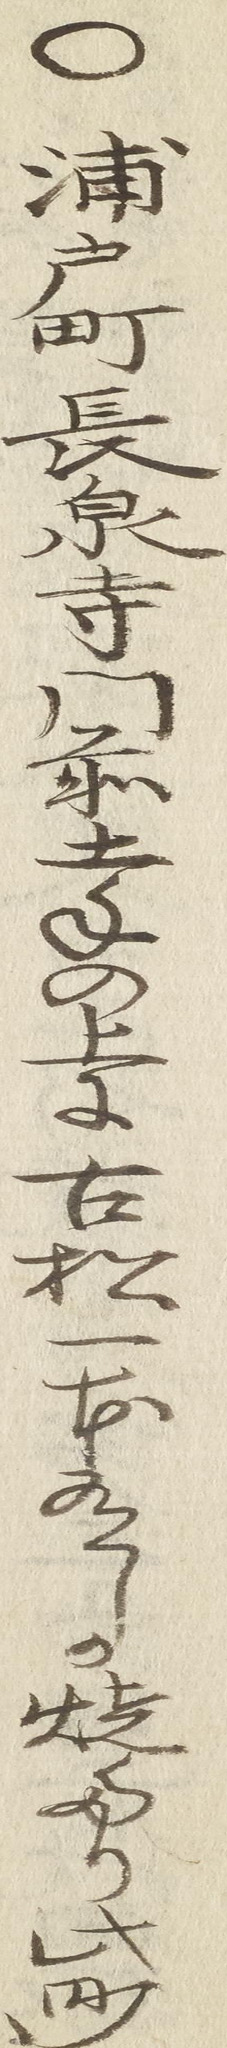〇浦戸町長泉寺門前土手の上に古松一本有しか焼たり此町は
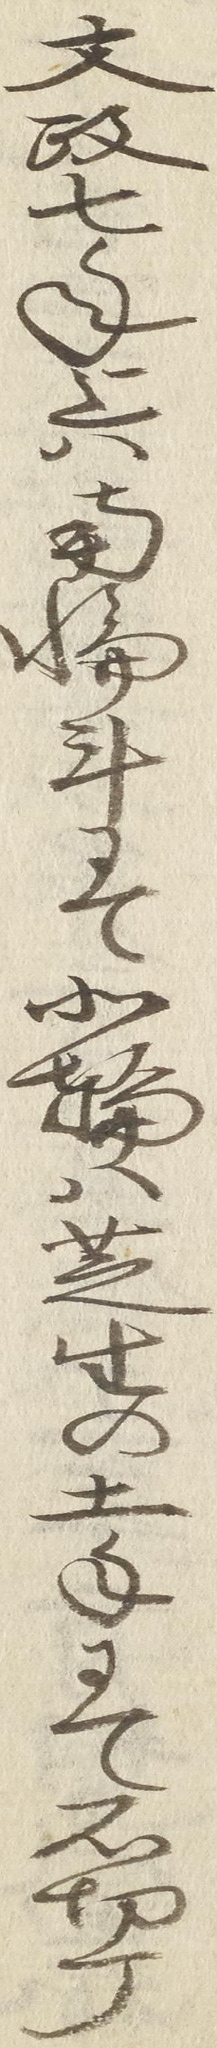文政七年上は上は南輪斗にて北輪は芝生の土手にて石切丁
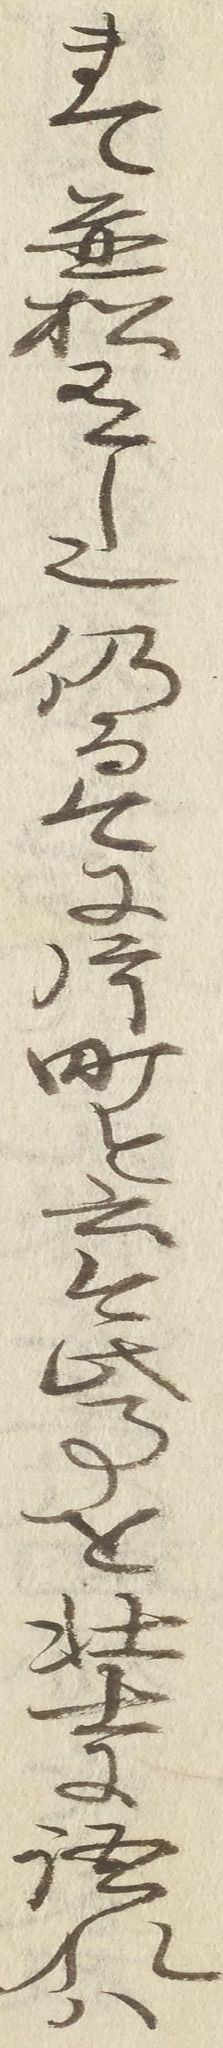まて並松有し也仍て今に片町と云今此事を壮士に語れは
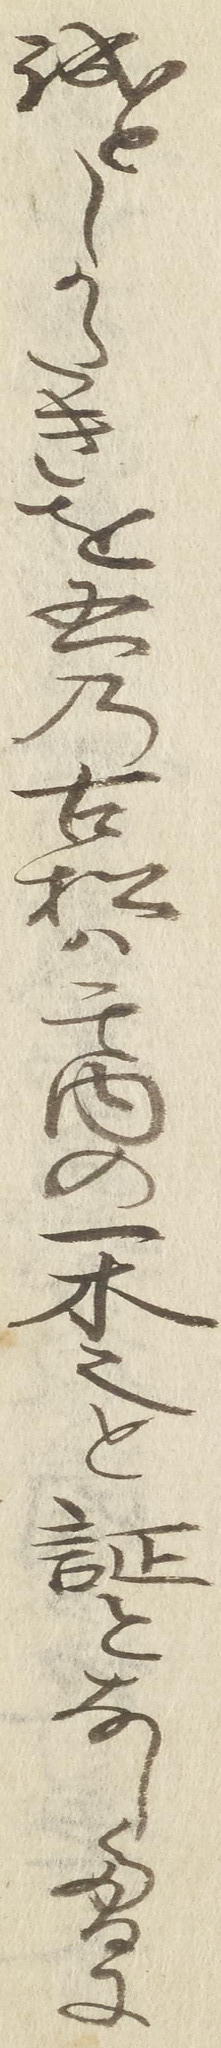誠としかたきを右の古松は其内の一木也と証となしたるに
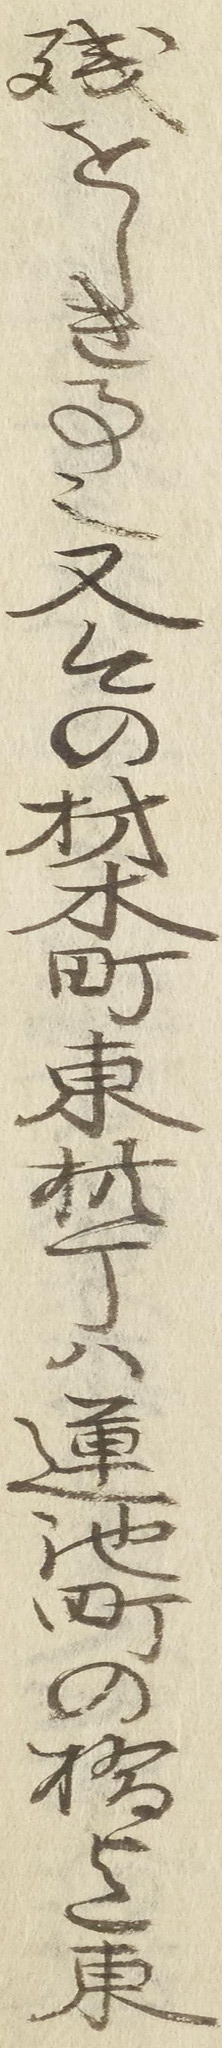残をしき事也又今の材木町東横丁ハ蓮池町の橋迄東
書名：地震記　上
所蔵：東京大学地震研究所図書室 Earthquake Research Institute Library, The University of Tokyo, JAPAN
